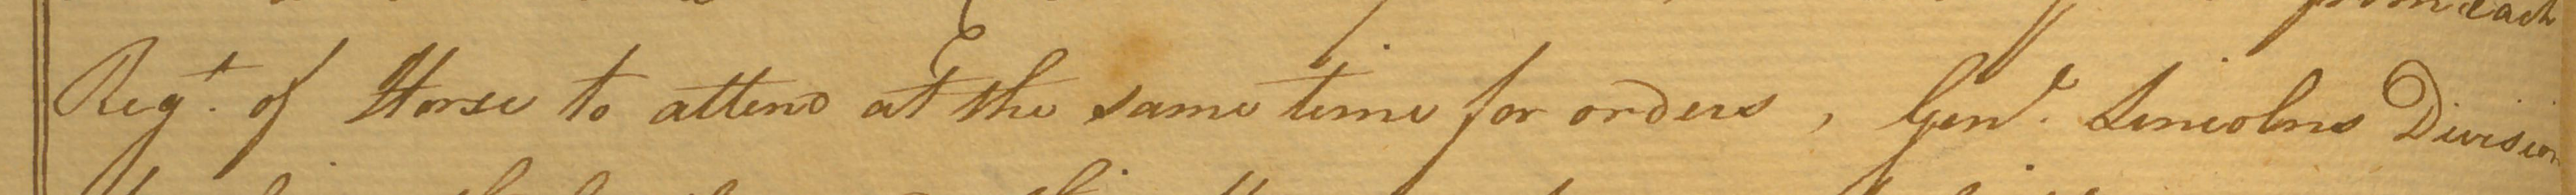Reg^t. of Horse to attend at the same time for orders, Gen^l. Lincolns Division
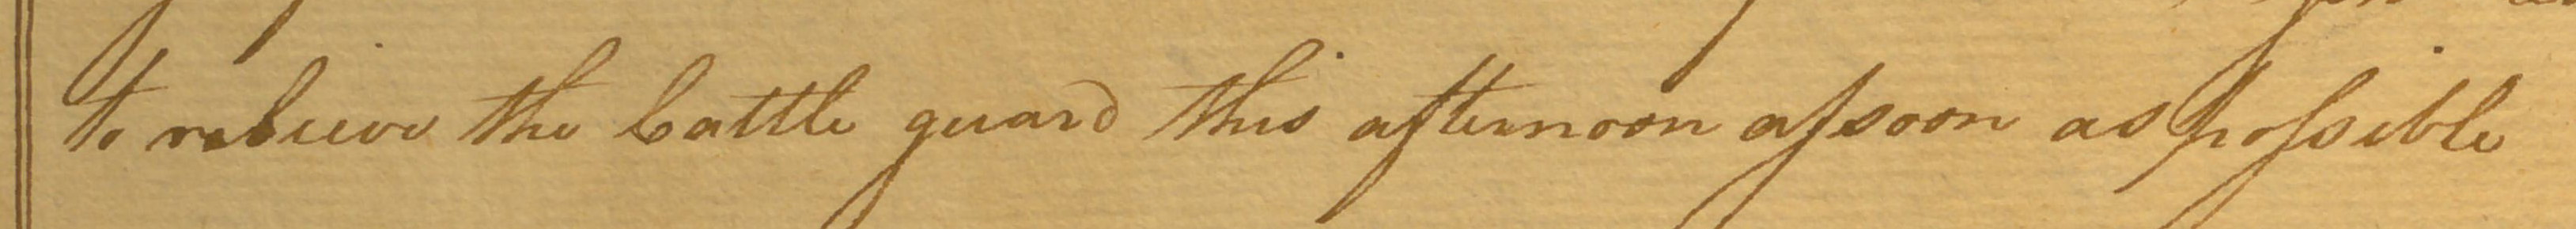to relieve the Cattle guard this afternoon as soon as possible
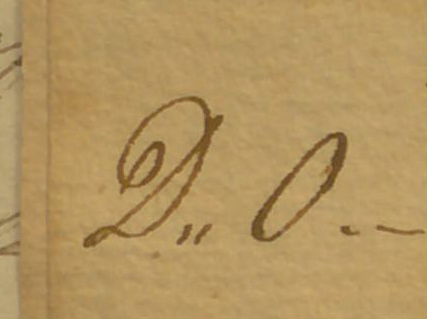D. O.-
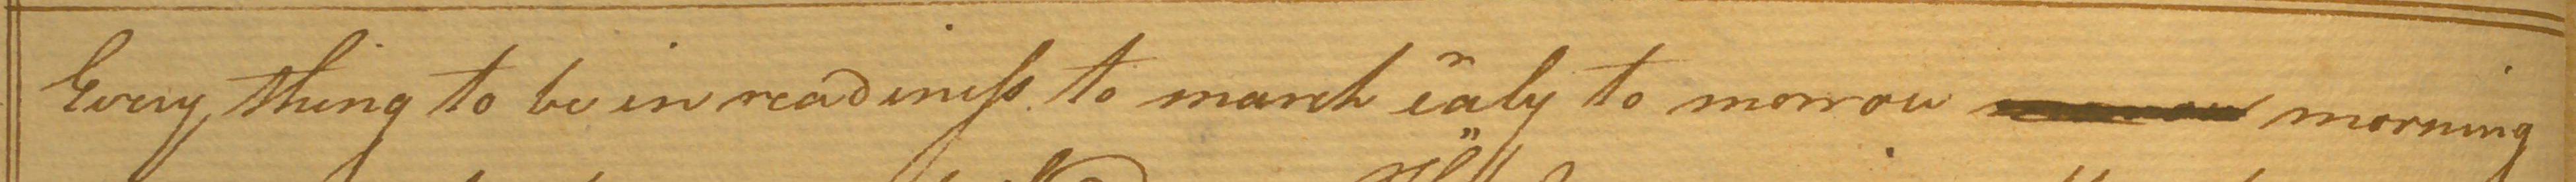Every thing to be in readiness to march ea^rly to morrow [______] morning
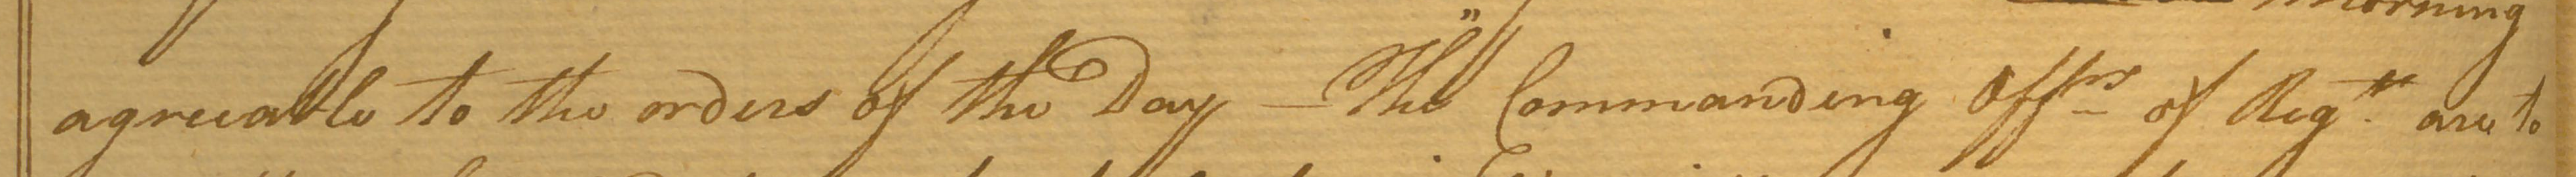agreeable to the orders of the Day- The Commanding Off^rs. of Reg^ts. are to
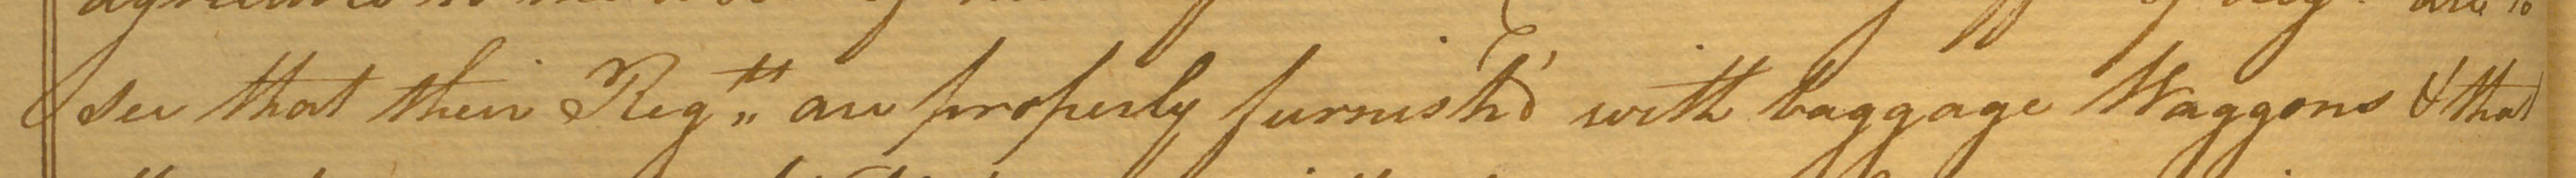see that their Reg^ts. are properly furnish'd with baggage Waggons & that
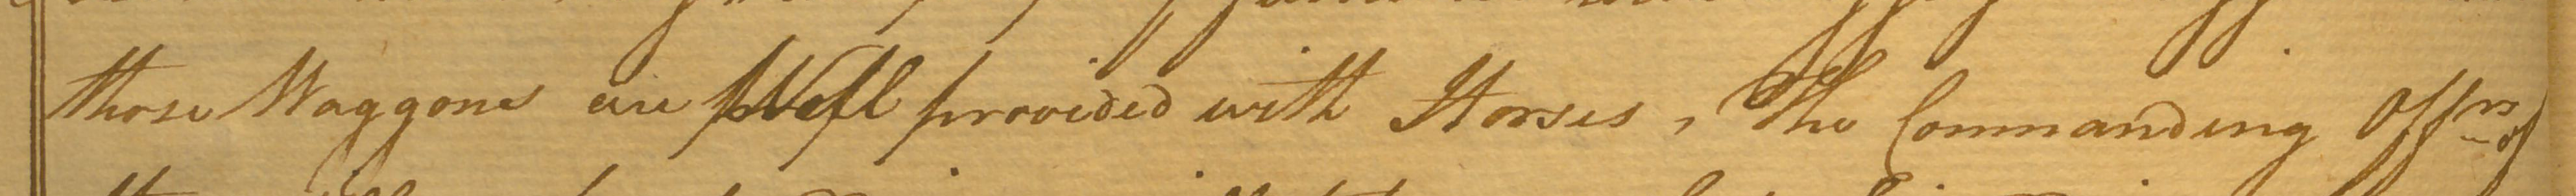those Waggons are Well provided with Horses, The Commanding Off^rs. of
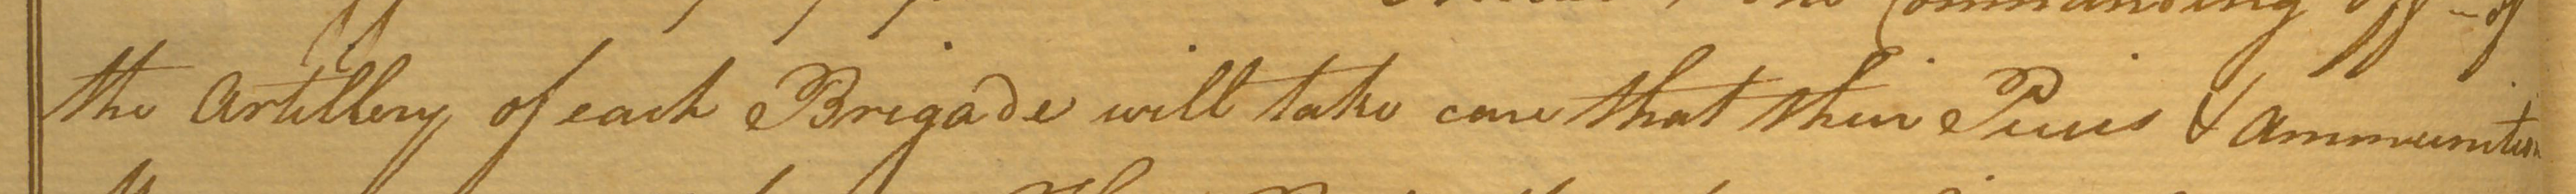the Artillery of each Brigade will take care that their Pieces & Ammunition
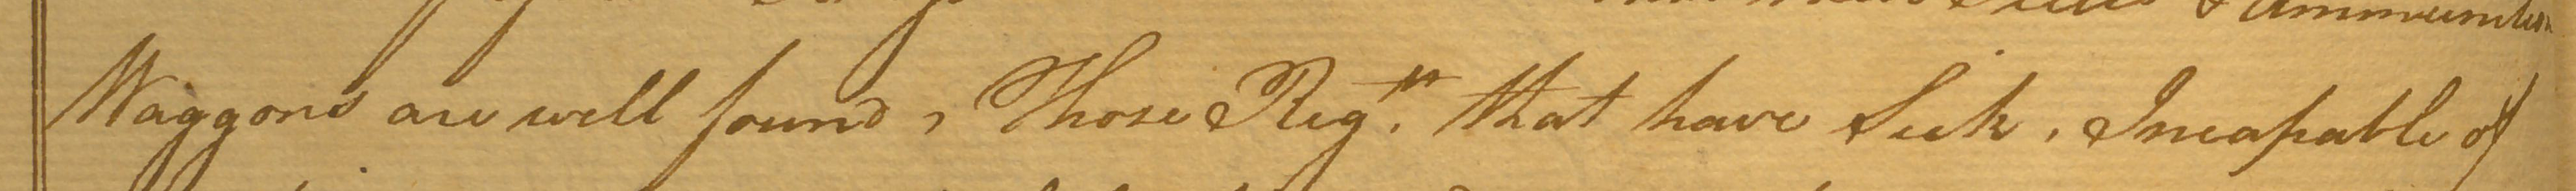Waggons are well found, Those Reg^ts. that have Sick, Incapable of
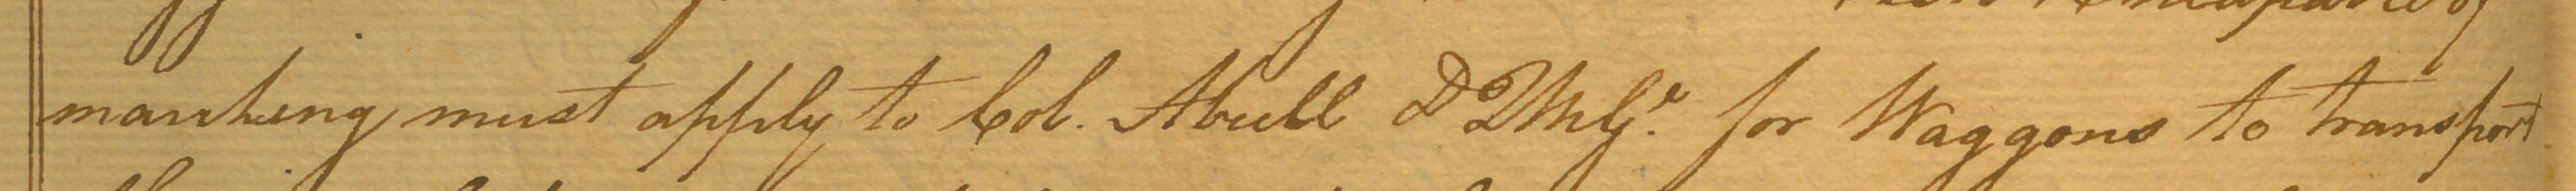marching must apply to Col. Abell DQMG^l. for Waggons to transport
